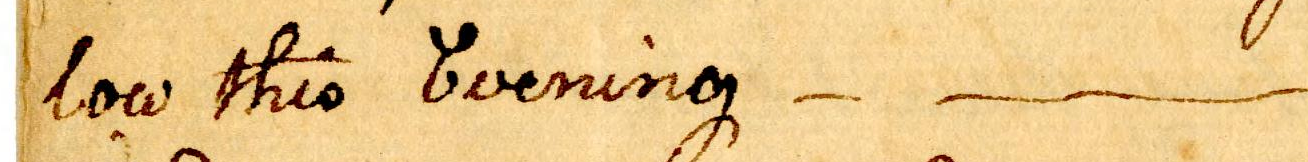low this Evening-
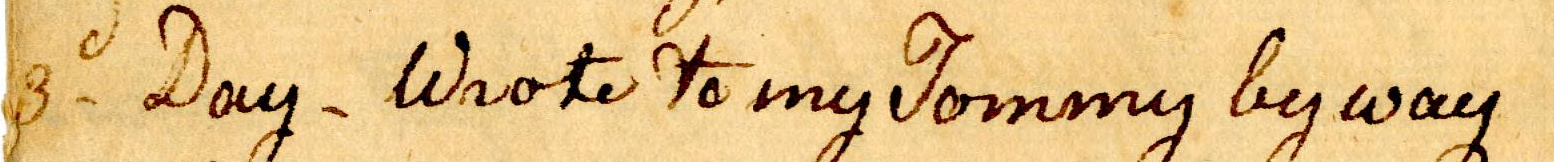3^d Day- Wrote to my Tommy by way
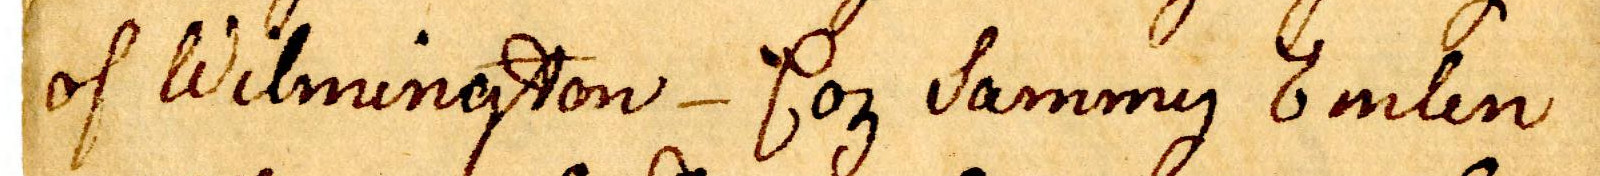of Wilmington- Coz Sammy Emlen
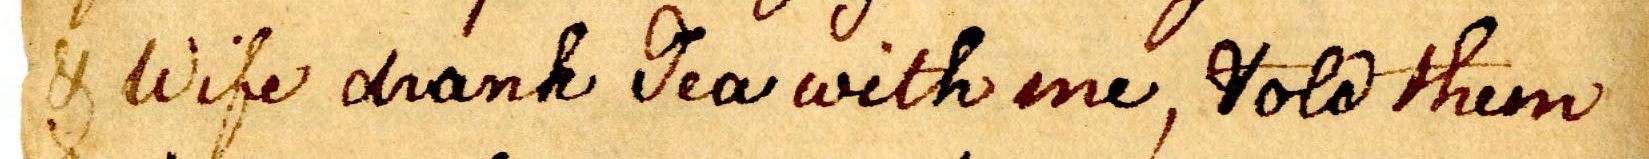& Wife drank Tea with me, told them
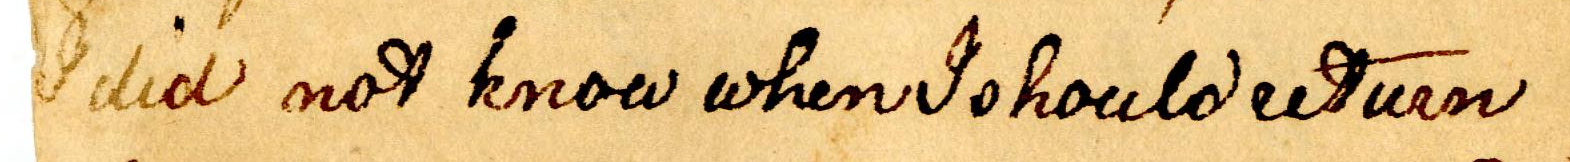I did not know when I should return
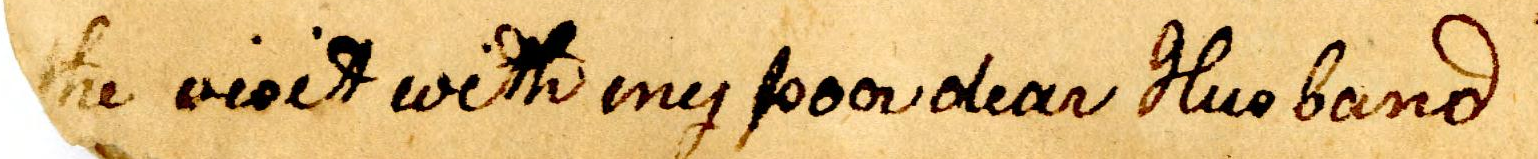the visit with my poor dear Husband
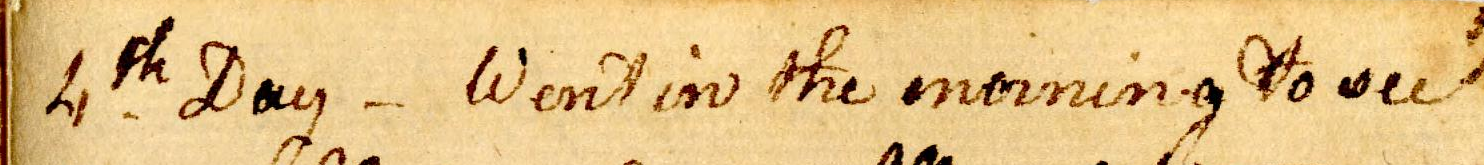4^th Day- Went in the morning to see
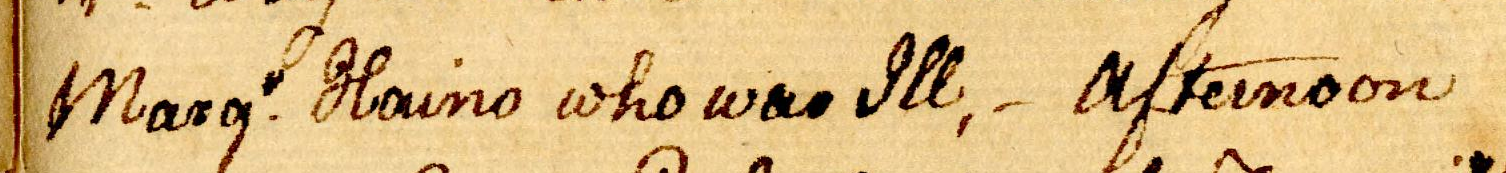Marg^r. Hains who was Ill,- Afternoon
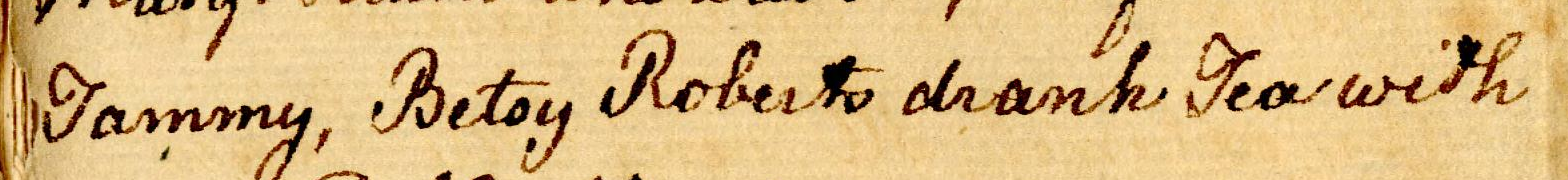Tammy, Betsy Roberts drank Tea with
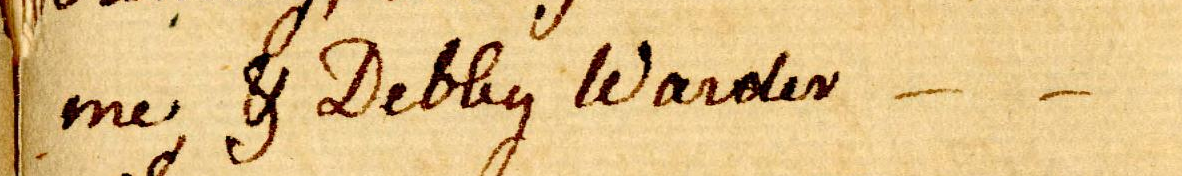me, & Debby Warder-
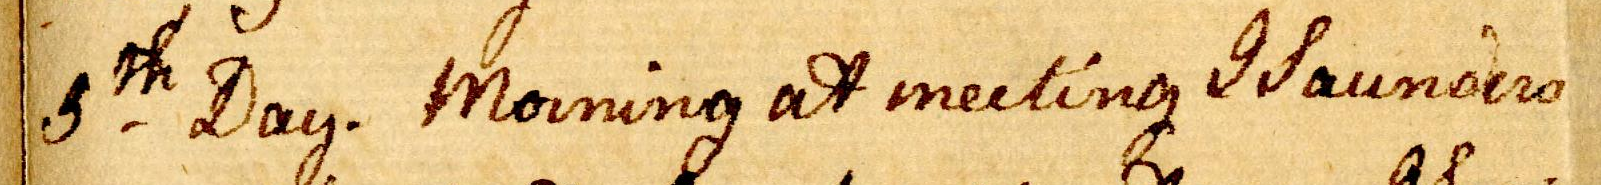5^th Day. Morning at meeting I Saunders
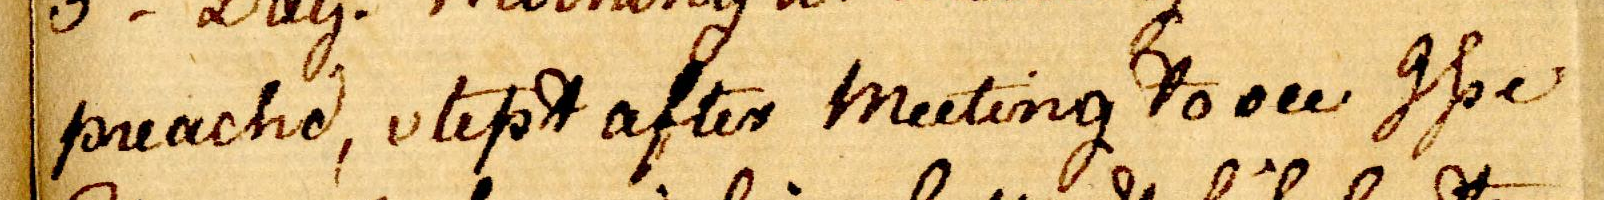preachd, stept after Meeting to see Jsse
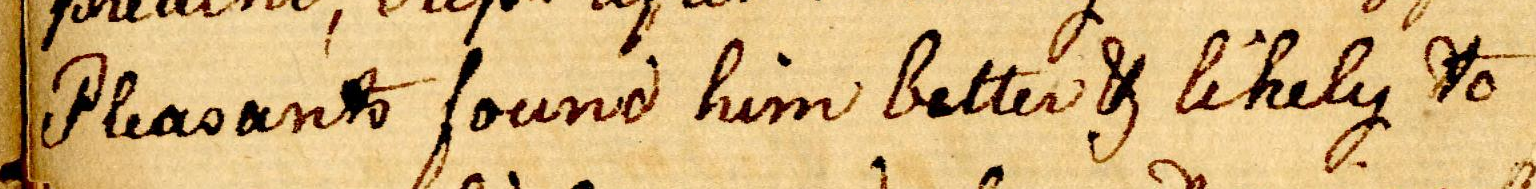Pleasants found him better & likely to
